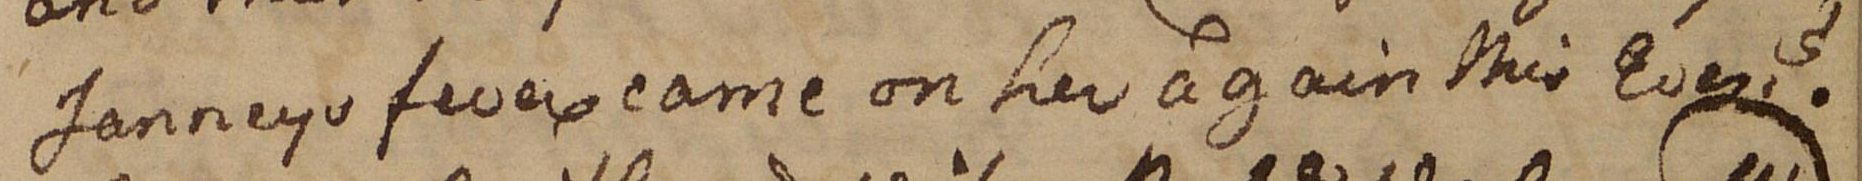Janneys fever came on her again this Even^g.
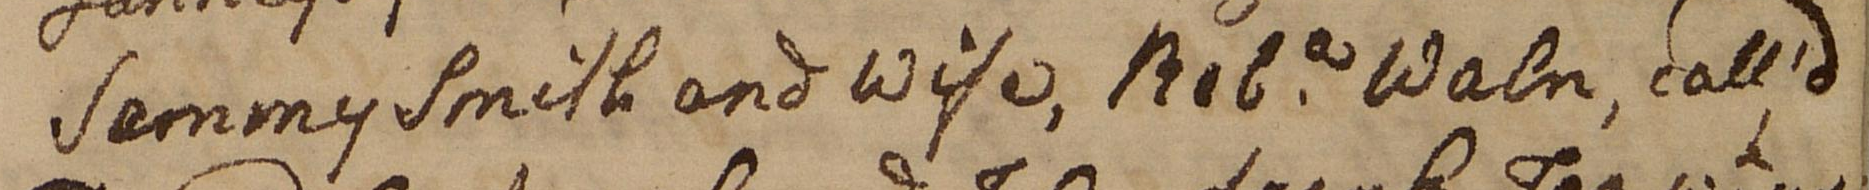Sammy Smith and Wife, Reb^a. Waln, call'd
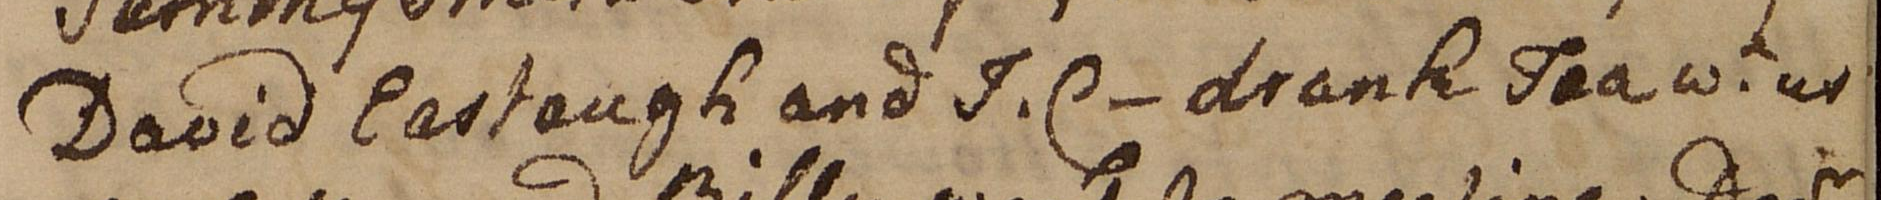David Eastaugh and J.C- drank Tea w^h. us
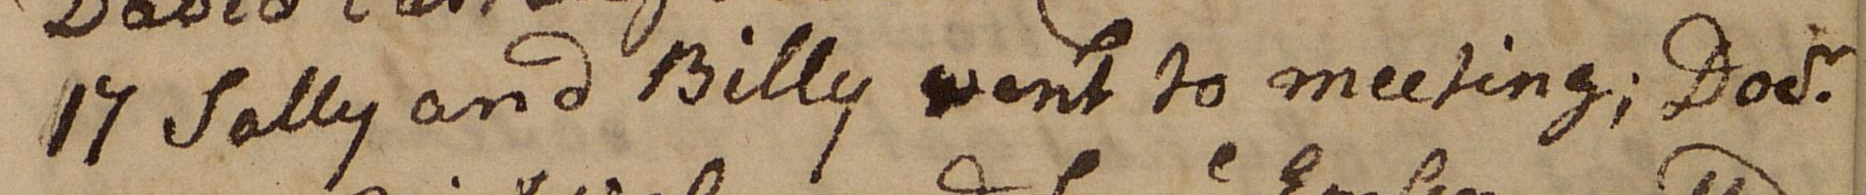17 Sally and Billy went to meeting; Doc.^r
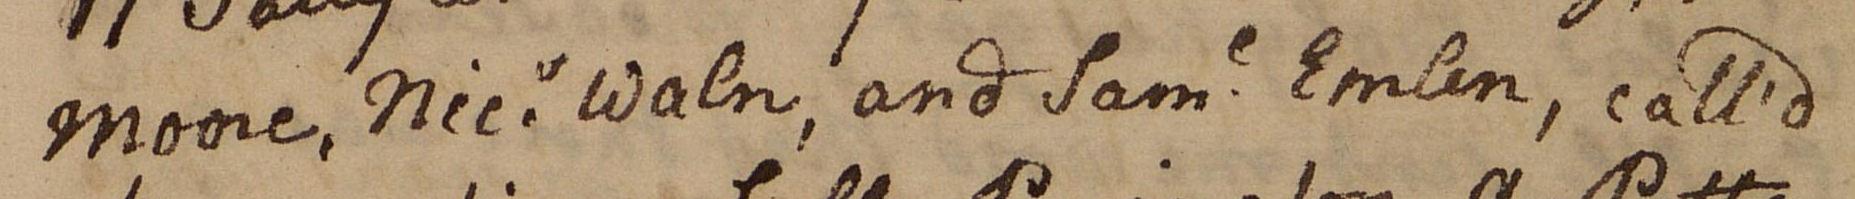Moore, Nic^s. Waln, and Sam^l. Emlen, call'd
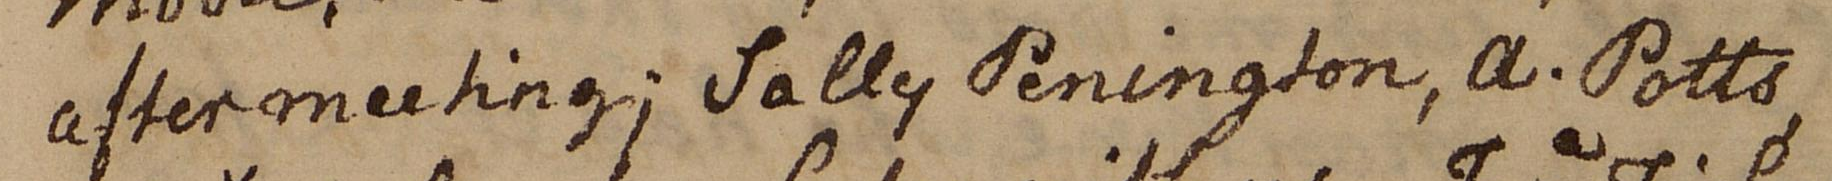after meeting; Sally Penington, A. Potts
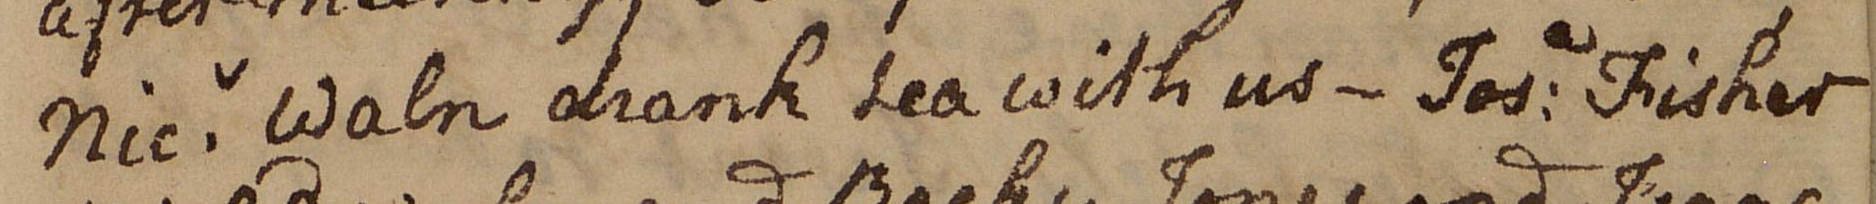Nic^s. Waln drank tea with us- Jos^a: Fisher
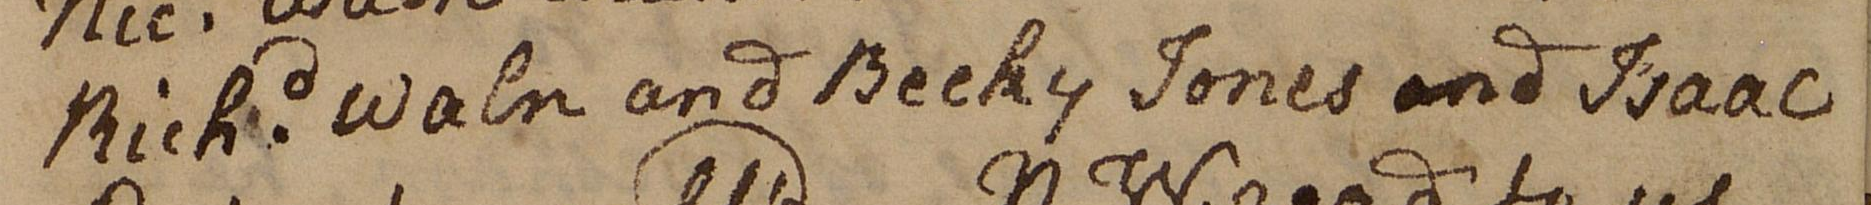Rich^d. Waln and Becky Jones and Isaac
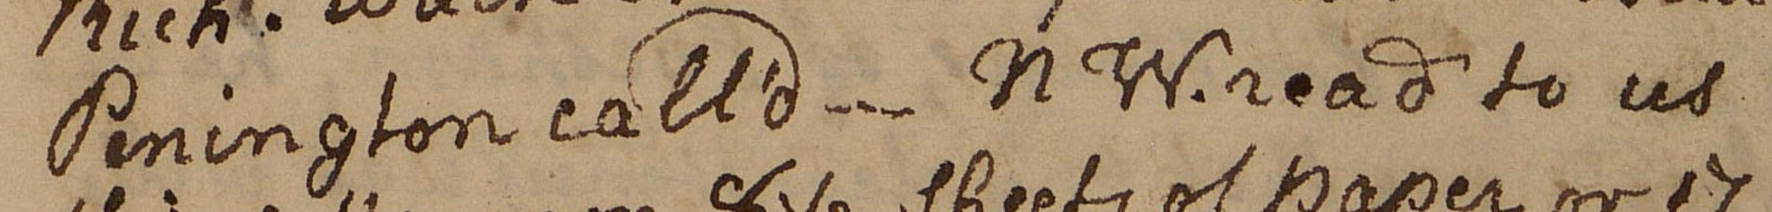Penington call'd- N W. read to us
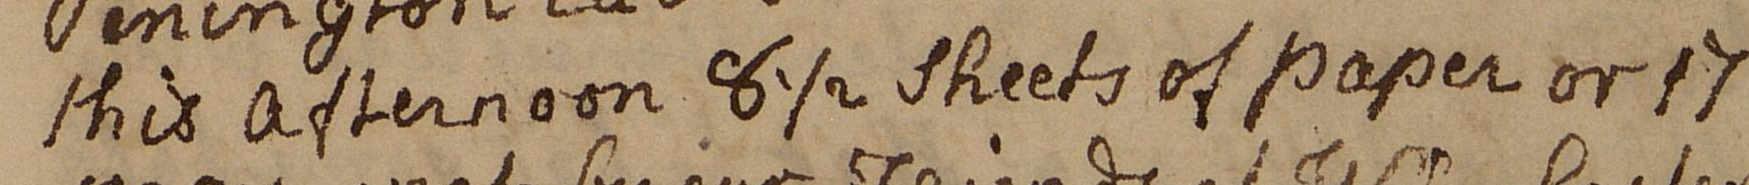this afternoon 8 1/2 Sheets of paper or 17
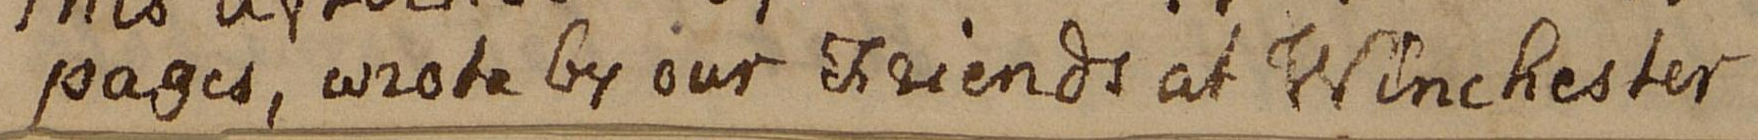pages, wrote by our Friends at Winchester
